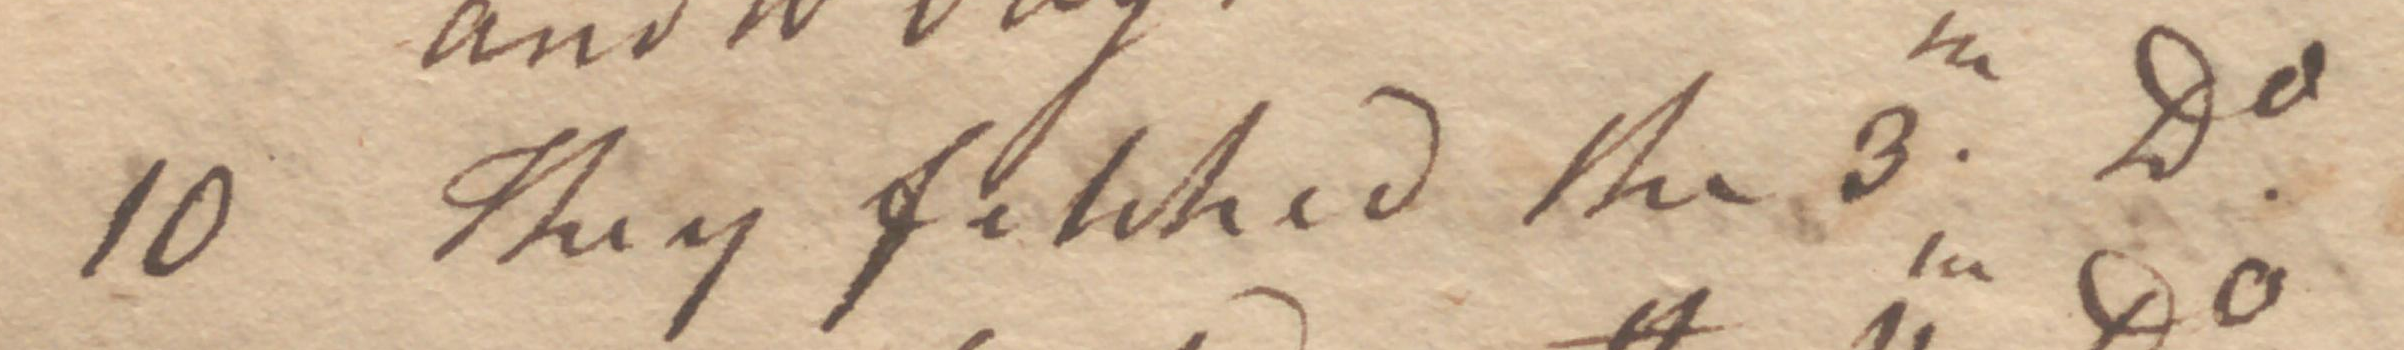10 They fetched the 3^th. D^o.
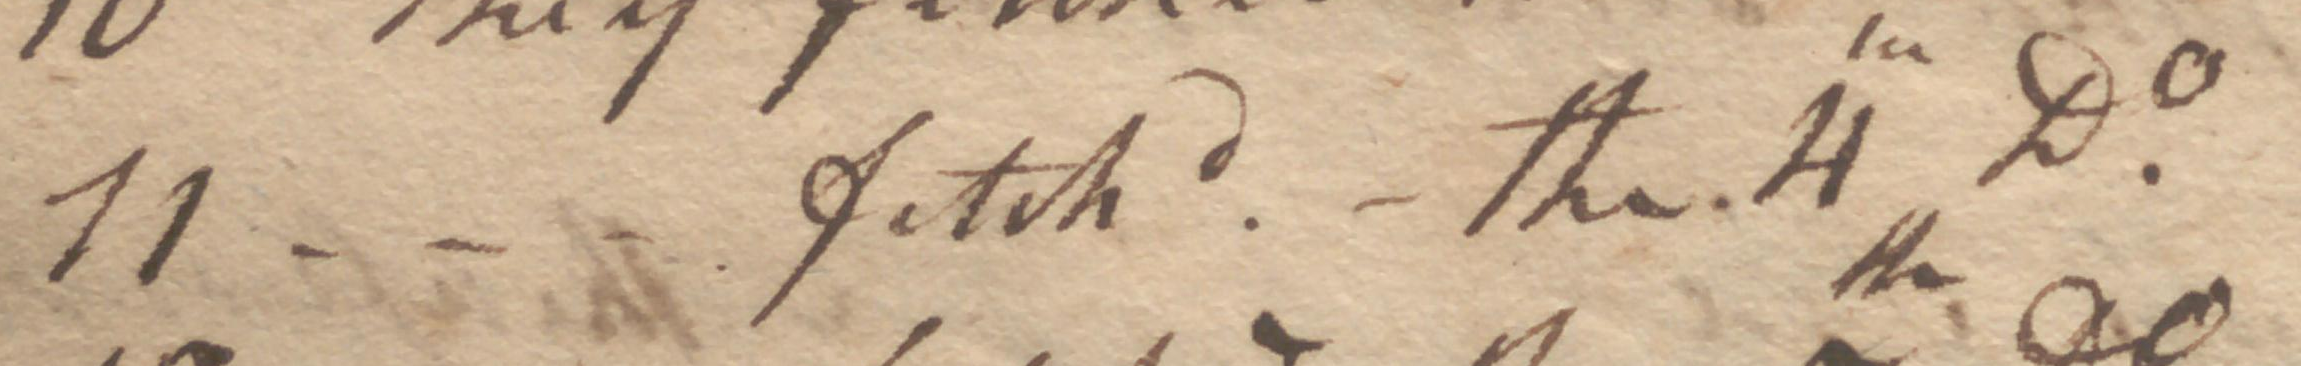11 fetch^d. the 4^th. D^o.
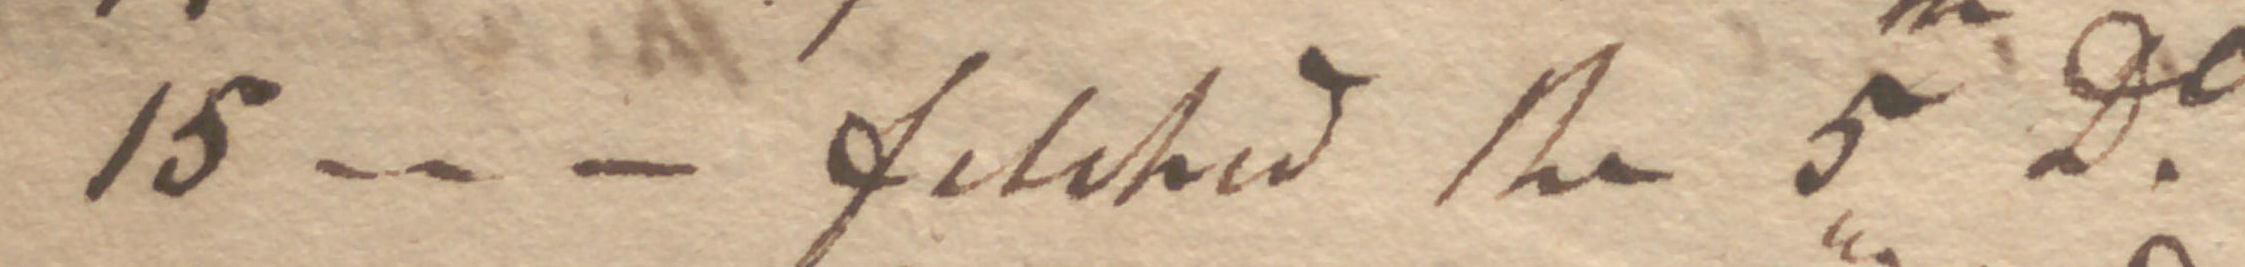15- fetched the 5^th D^o.
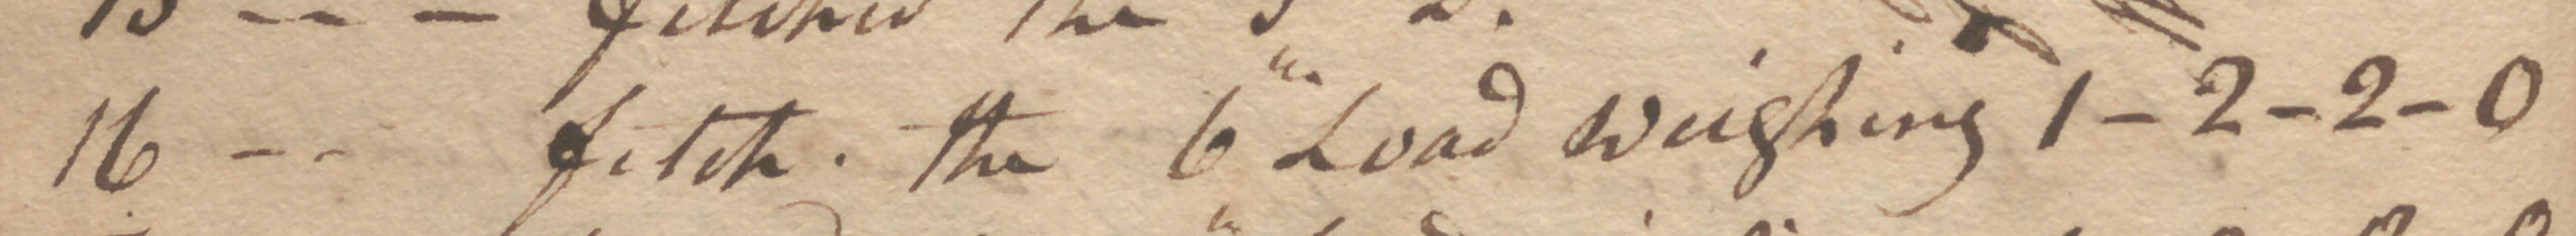16 fetch. the 6^th Load Weighing 1-2-2-0
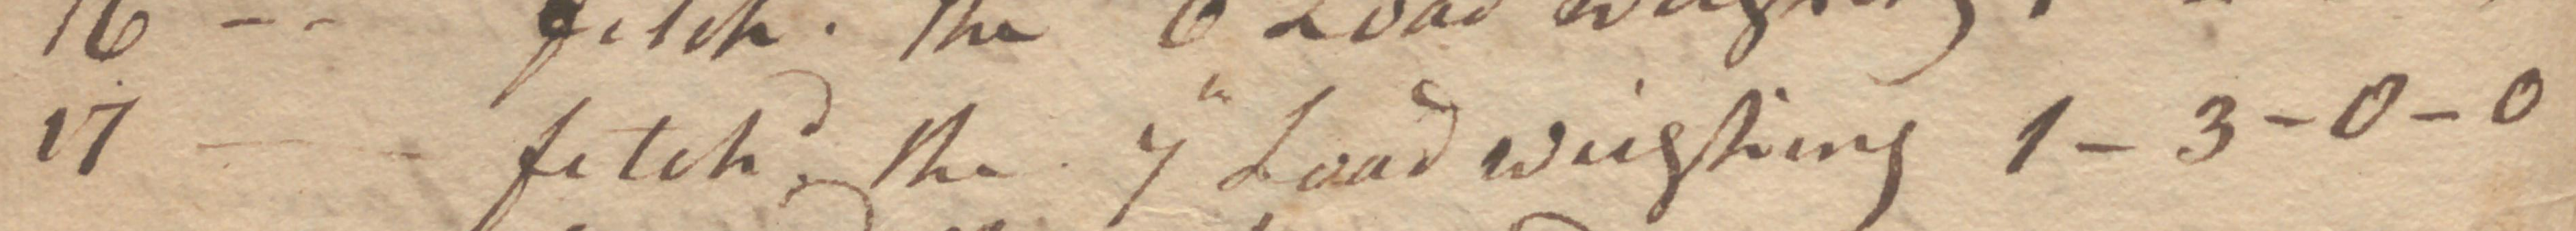17 fetch^d. the 7^th Load weighing 1-3-0-0
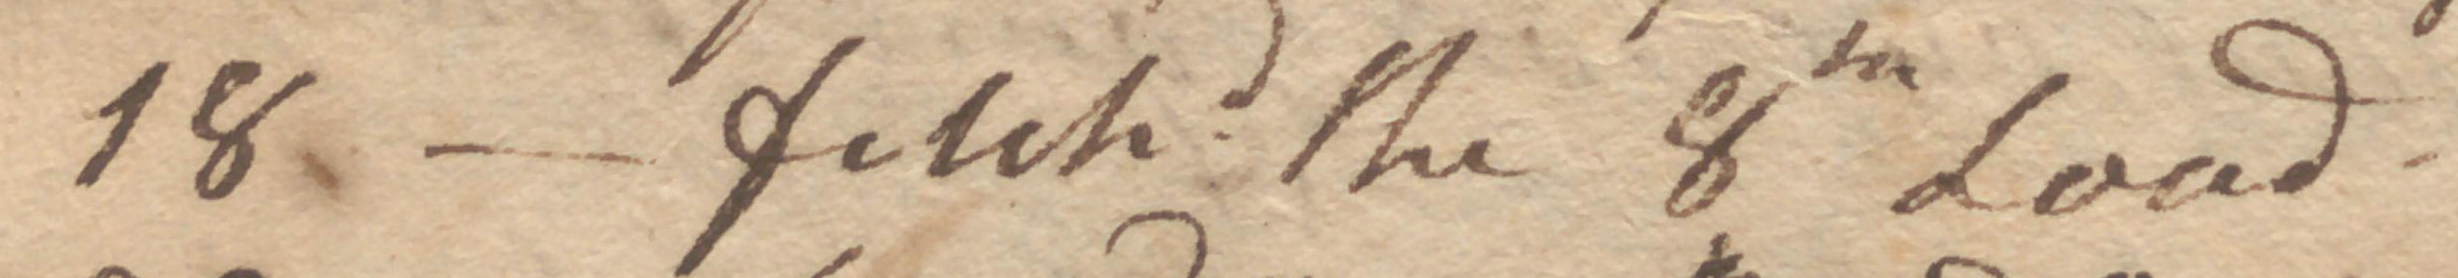18- fetch^d. the 8^th Load
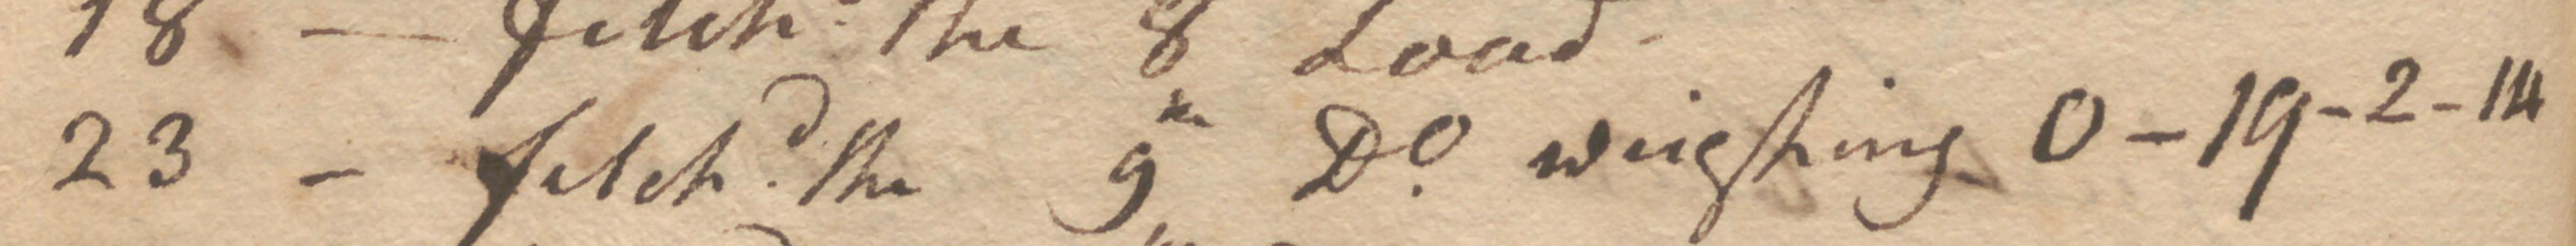23- fetch^d. the 9h D^o. weighing 0-19-2-14
